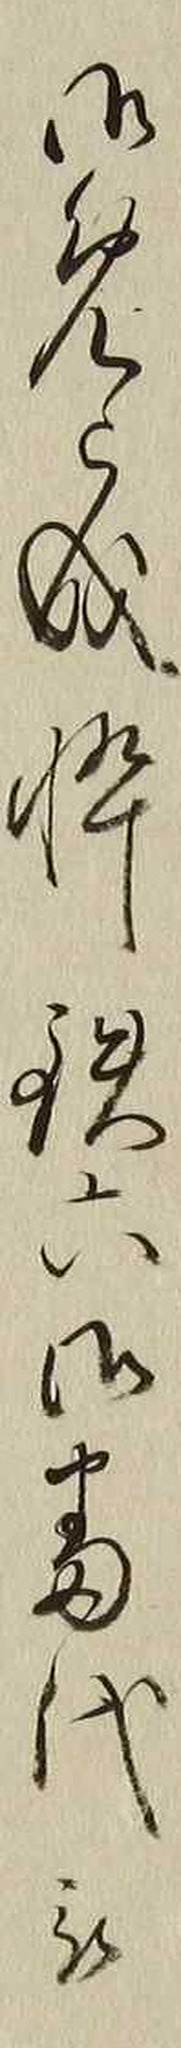御免被成忰鉄六御番代被
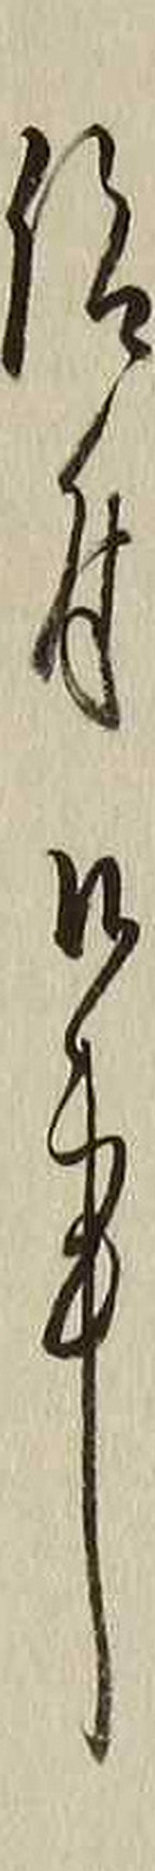仰付候事
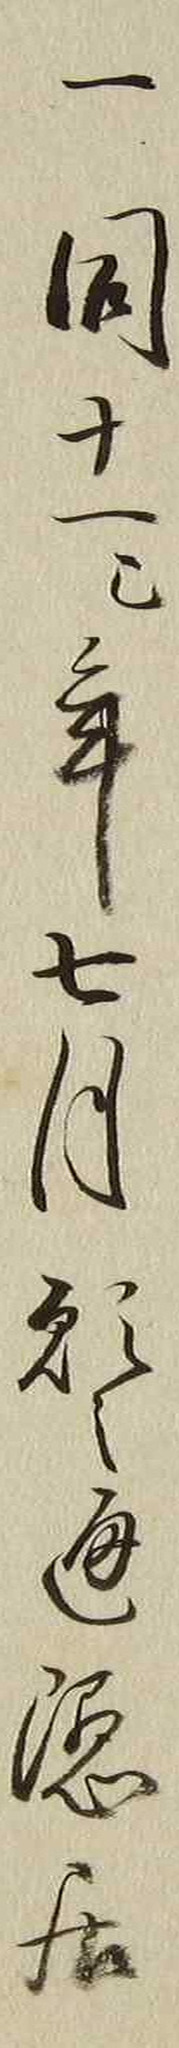一同十一巳年七月願之通隠居
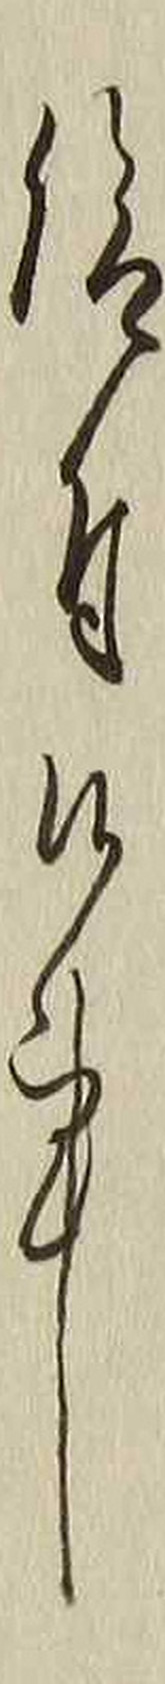仰付候事
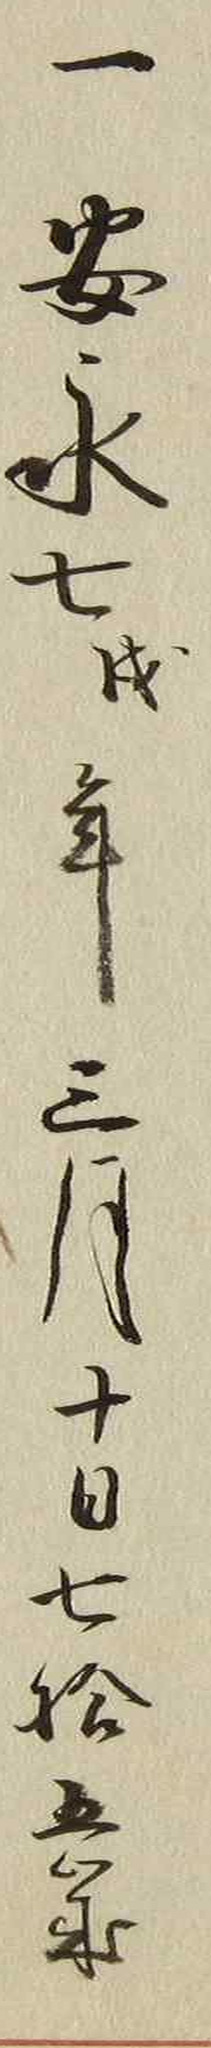一安永七戌年三月十日七拾五歳
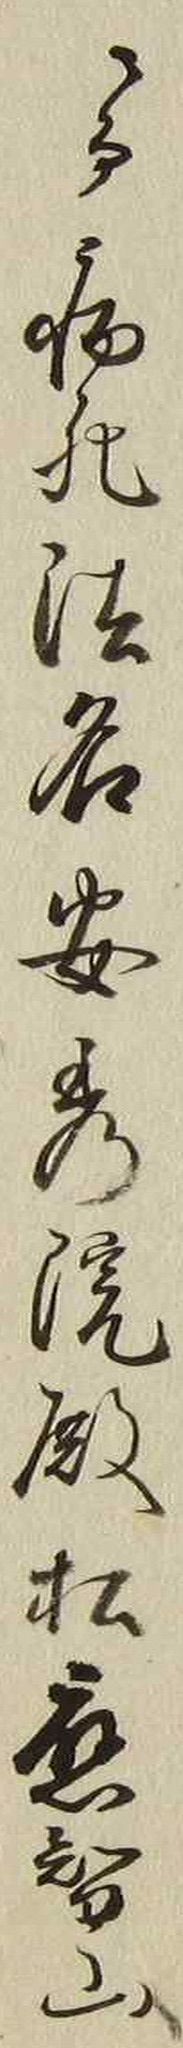ニ而病死法名安秀院殿松応智山
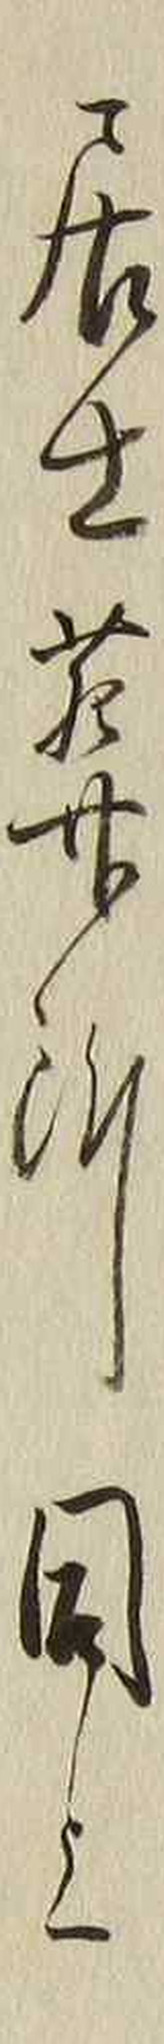居士葬所同上
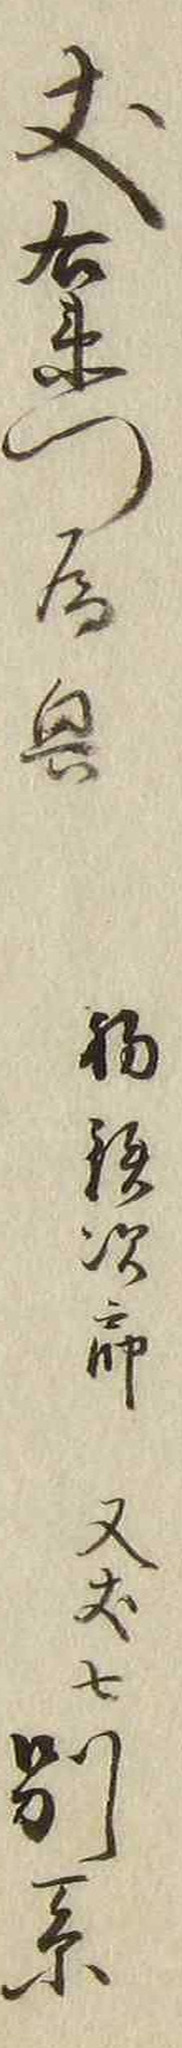丈右衛門為興初鉄次郎又丈七別系

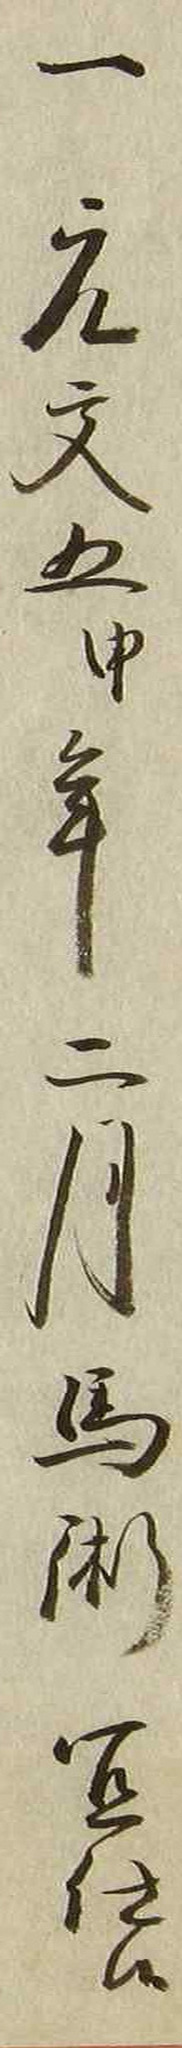一元文五申年二月馬術宜仕候
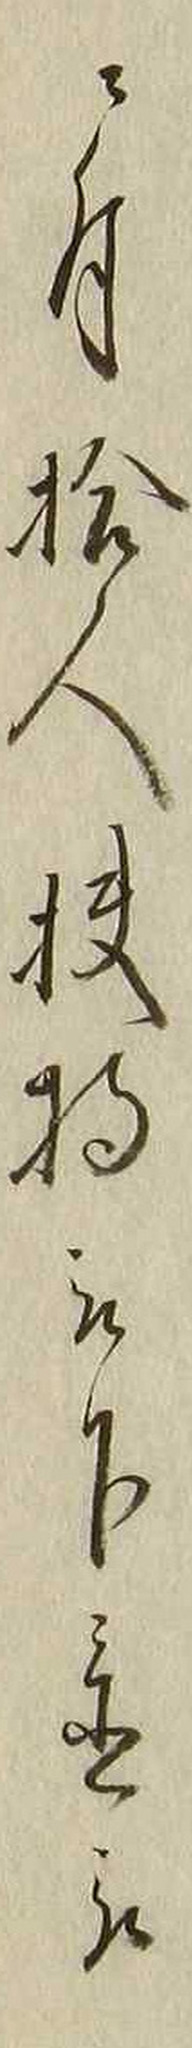ニ付拾人扶持被下置被
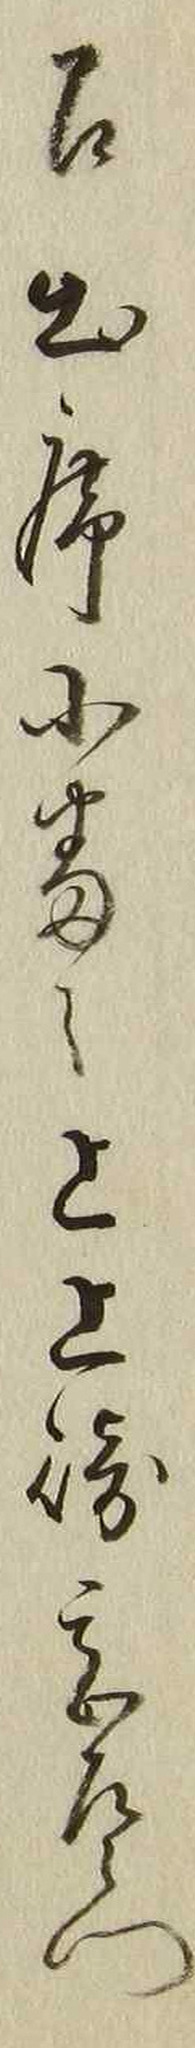召出席小番之上上崎甚左衛門
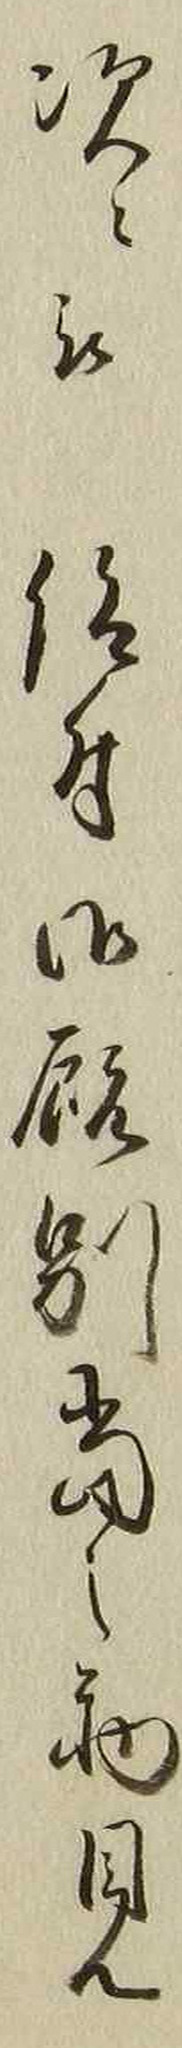次ニ被仰付御厩別当之勤見
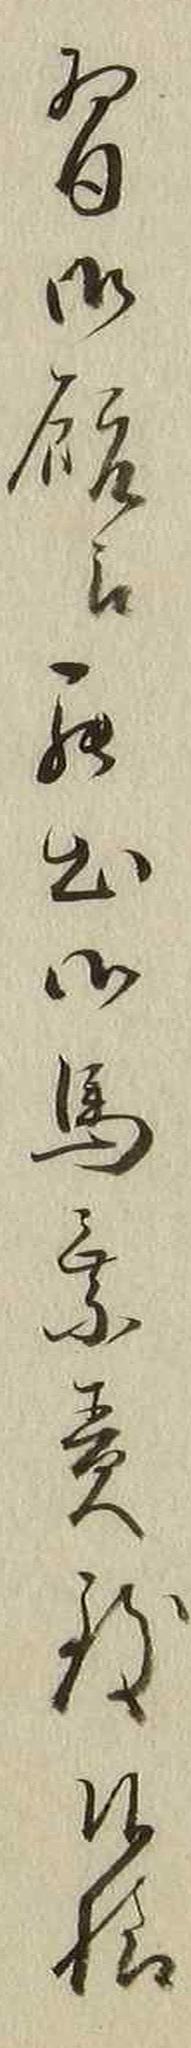習御厩江罷出御馬乗責致候様
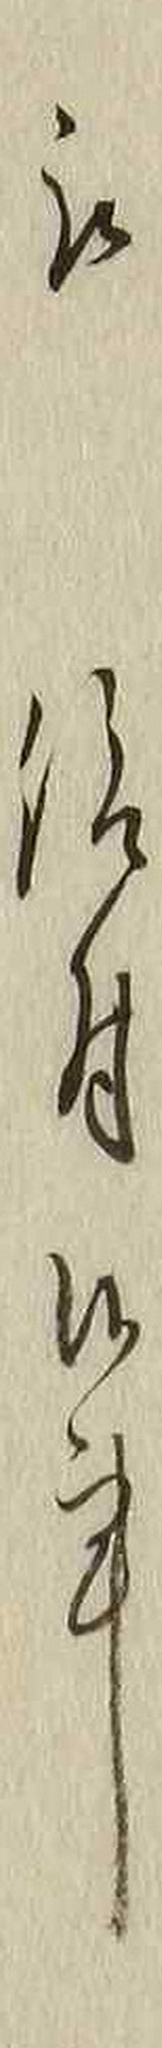被仰付候事
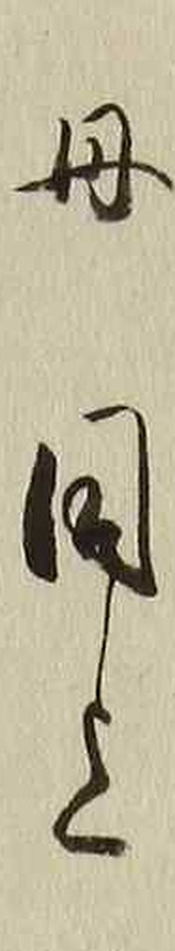母同上
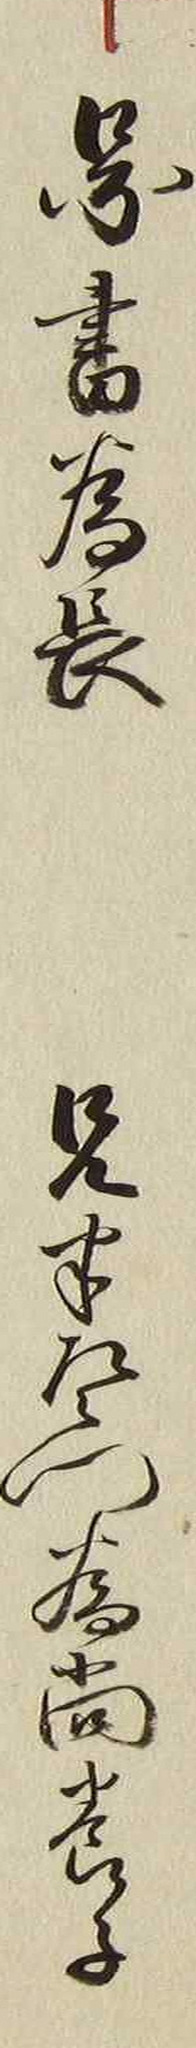図書為長兄半左衛門為尚養子
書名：諸士系譜　巻之18　い之部18
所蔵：会津若松市立会津図書館
